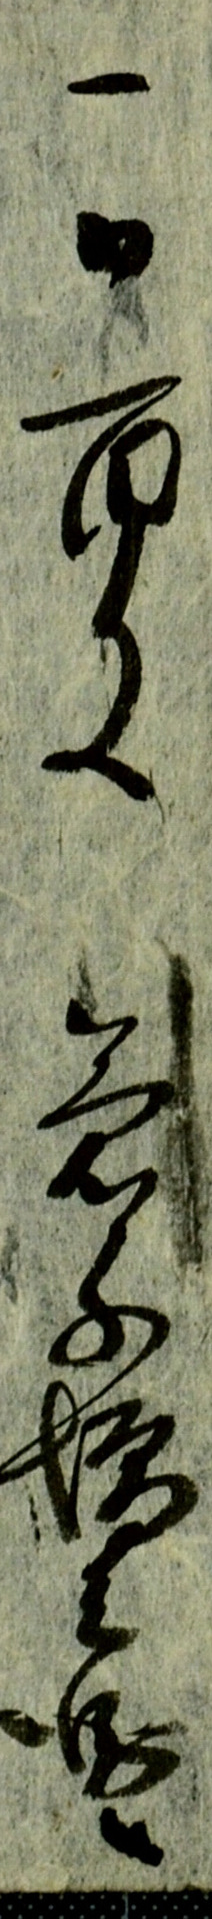一同百文兼子増兵衛
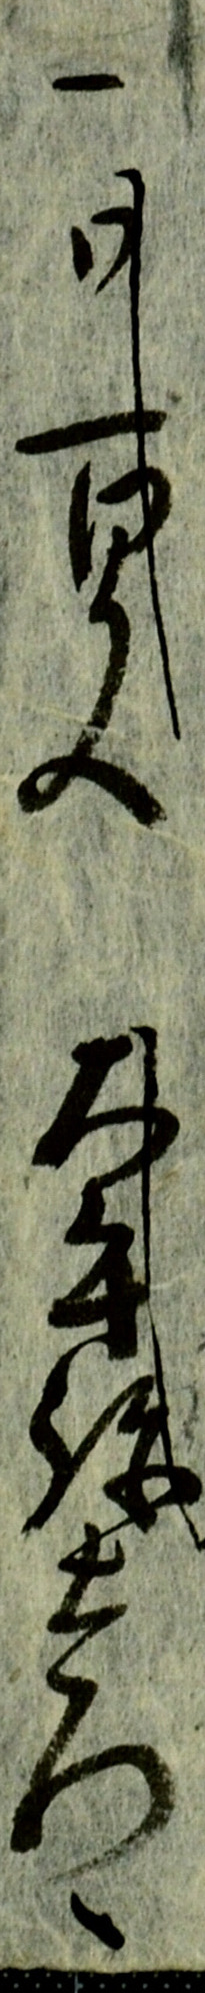一同百文大平弥右衛門
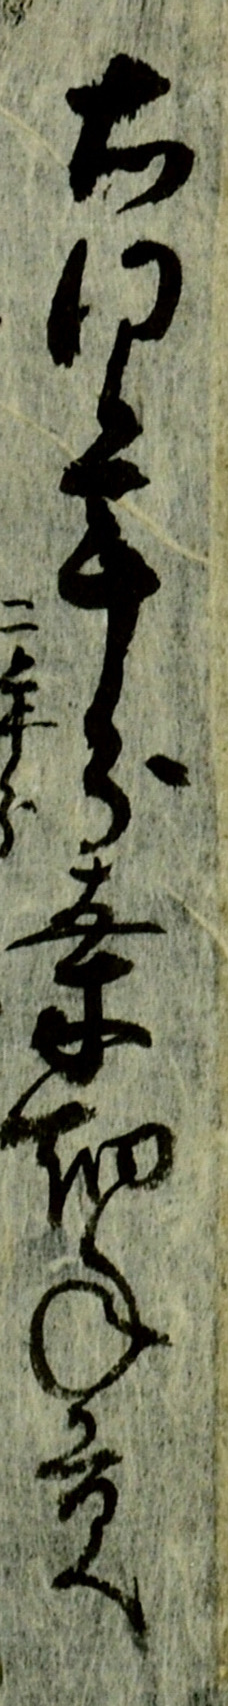右同年分桑畑年貢
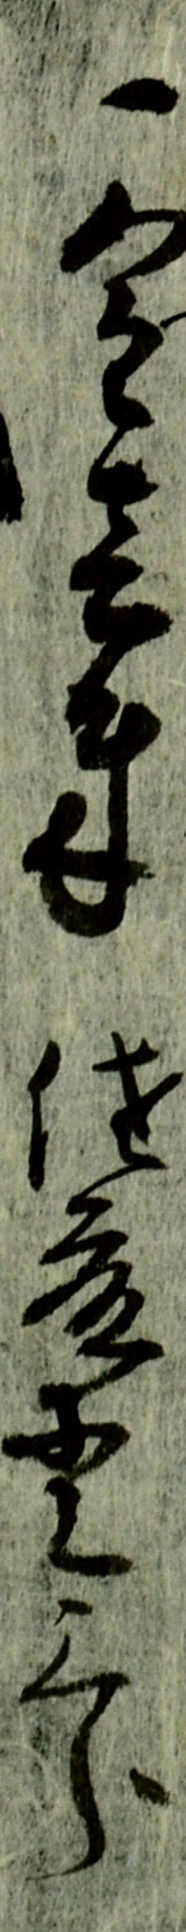一金壱朱佐藤杢三郎
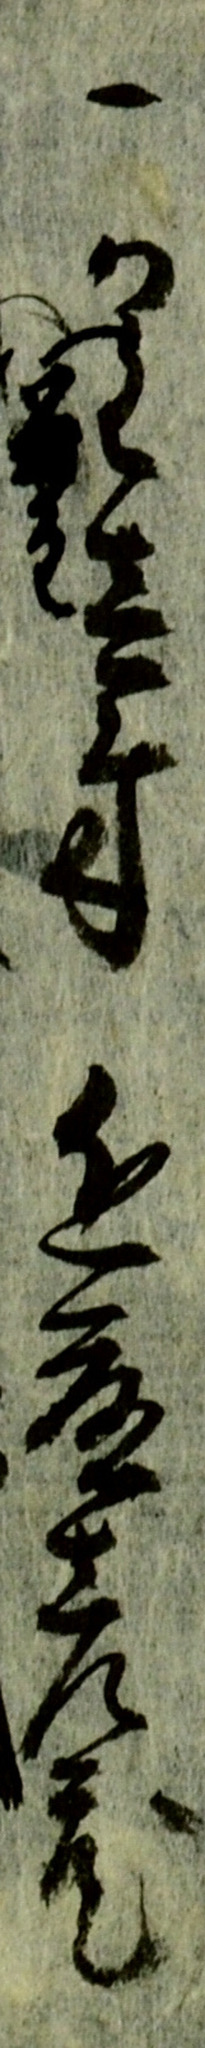一金壱朱近藤彦蔵
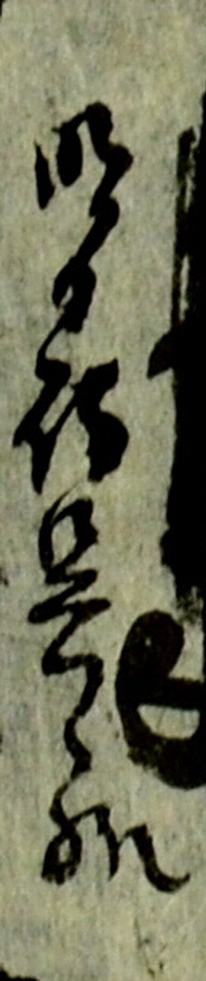明日待呉候様
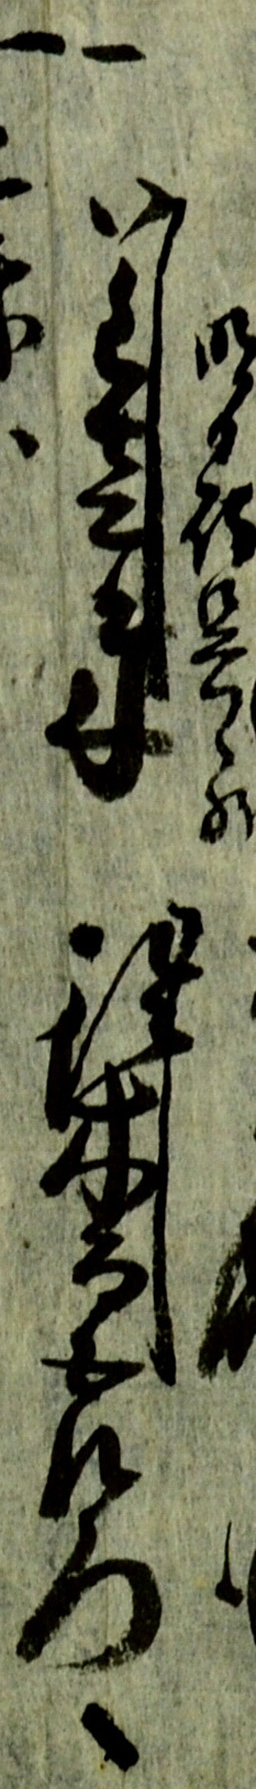一金壱朱鈴木与五左衛門
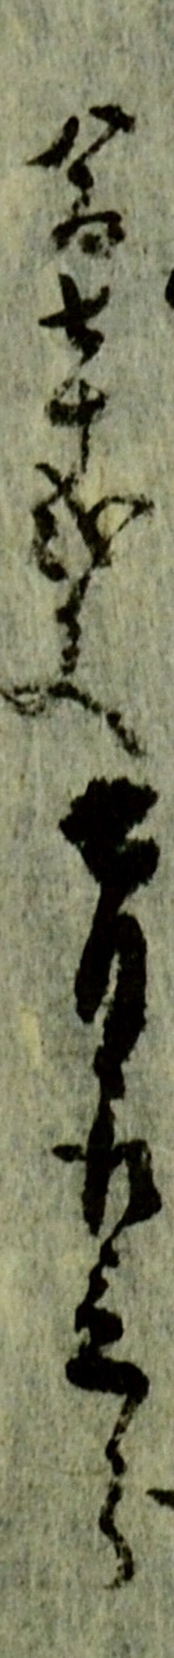八百七十弐文七月取立分

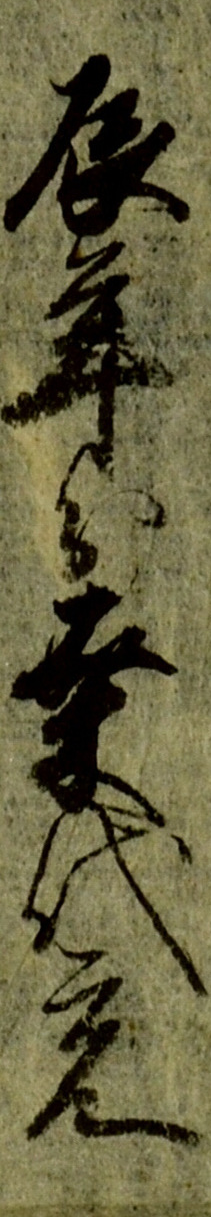辰年分桑代覚
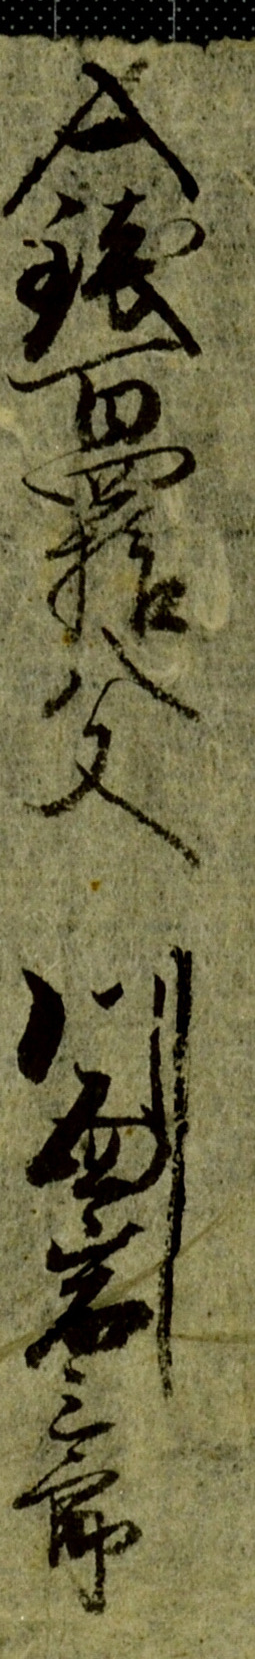一銭百四拾八文川西岩三郎
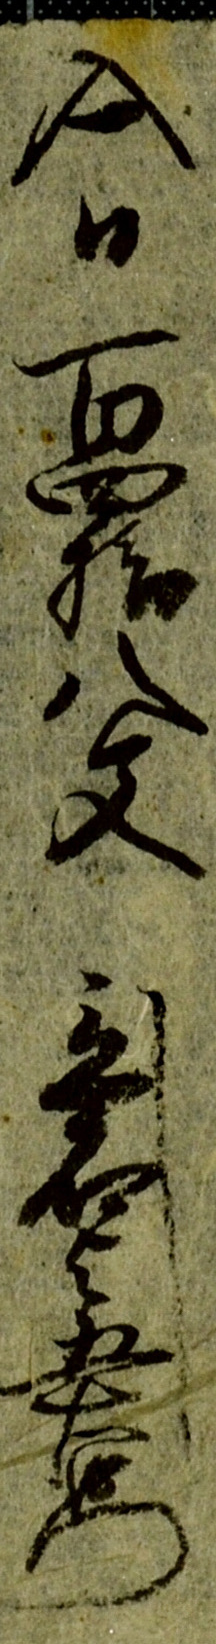一同百四拾八文立石与五右衛門
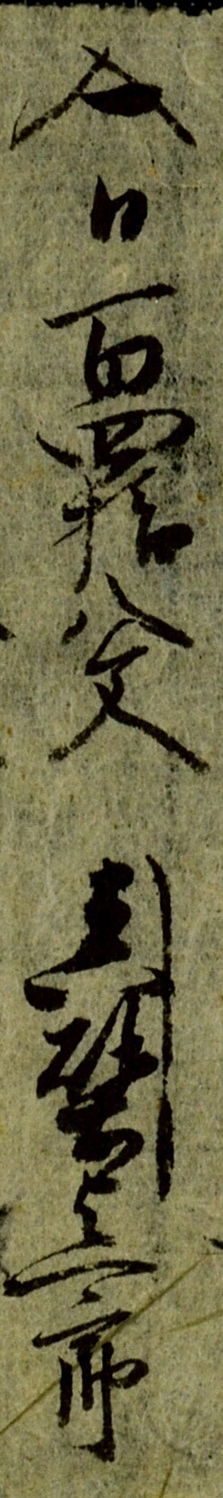一同百四拾八文真壁与一郎
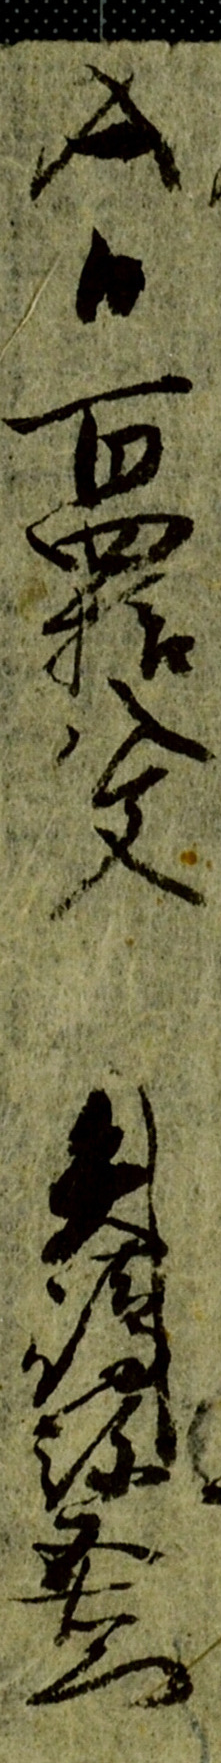一同百四拾八文矢島弥五右衛門
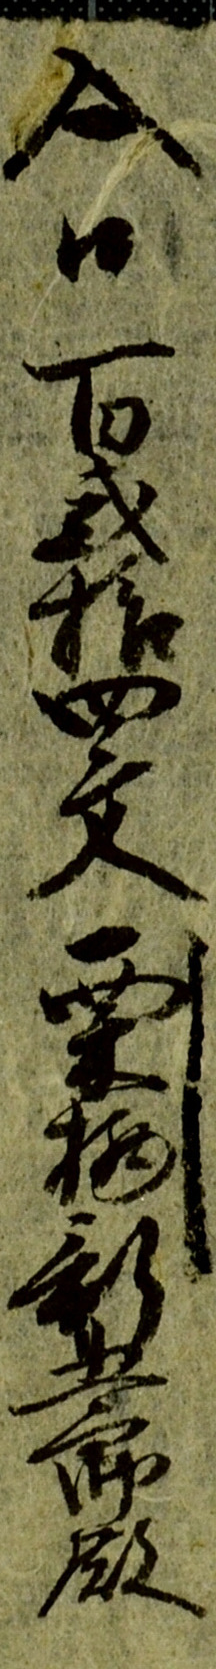一同百弐拾四文栗栖新五郎殿
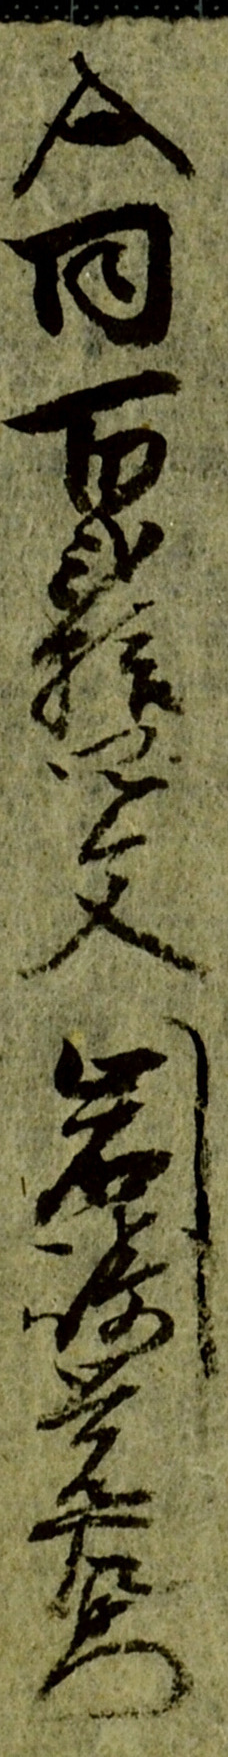一同百弐拾四文岩崎覚右衛門
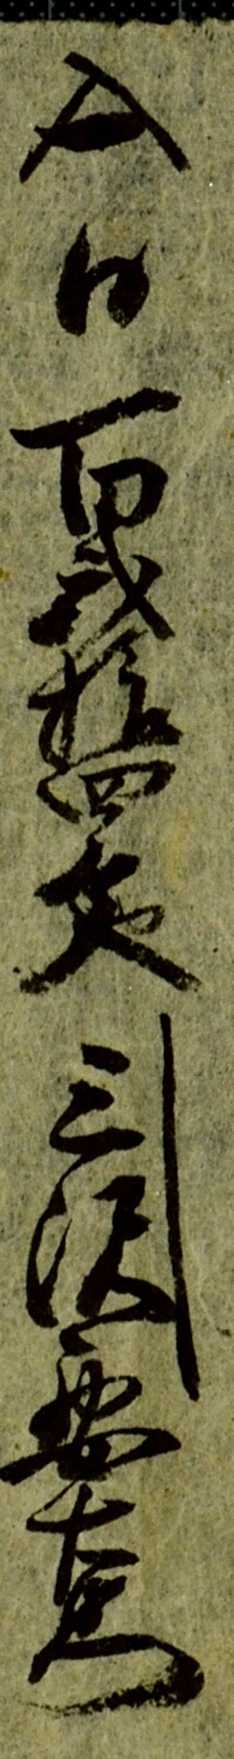一同百弐拾四文三沢要右衛門
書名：覚
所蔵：伊那市立高遠町図書館・合同会社AMANE
